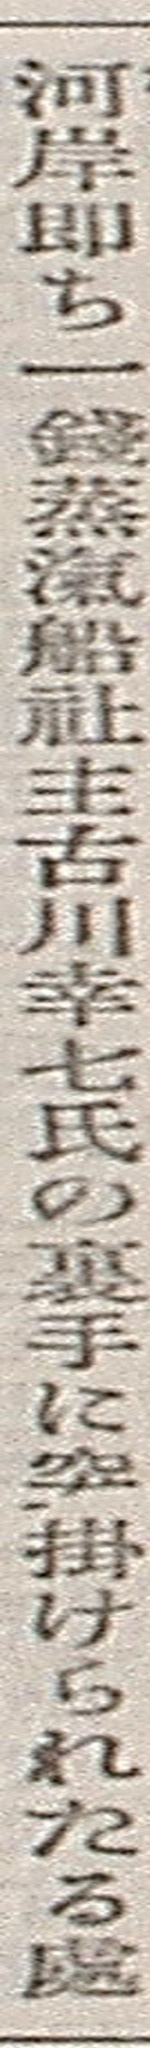河岸即ち一銭蒸気船社主古川幸七氏の裏手に突掛けられたる処
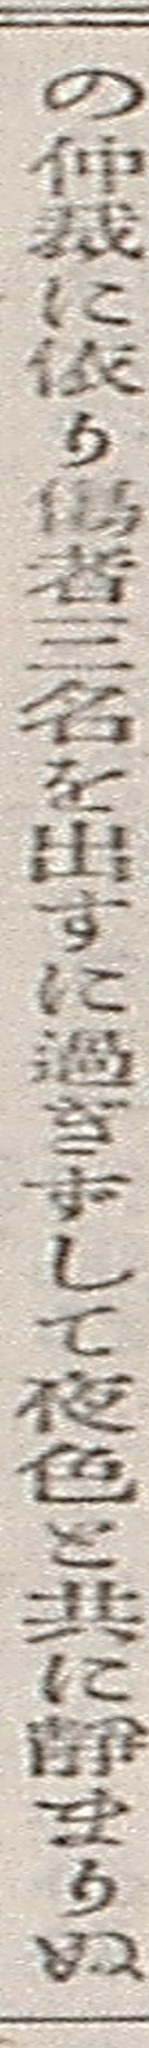の仲裁に依り傷者三名を出すに過ぎずして夜色と共に静まりぬ
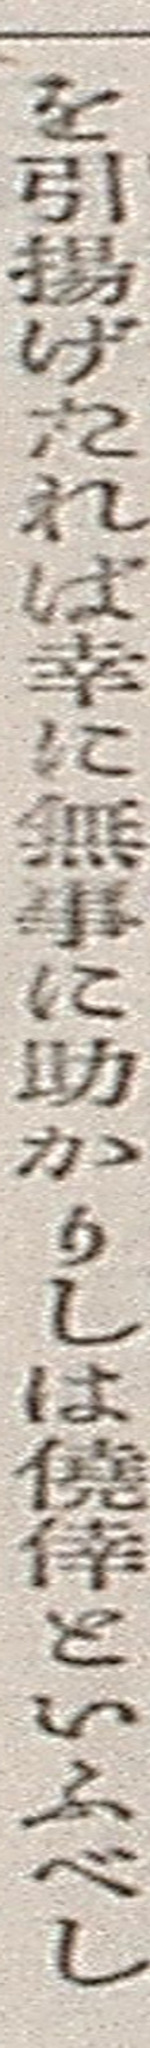を引揚げたれば幸に無事に助かりしは僥倖といふべし
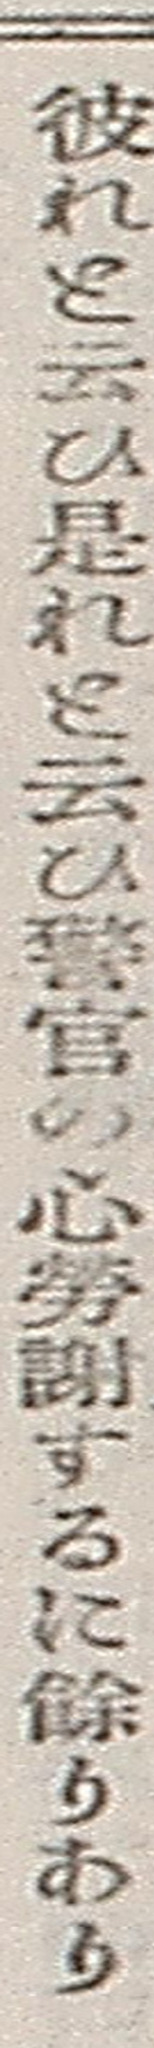彼れと云ひ是れと云ひ警官の心労謝するに余りあり
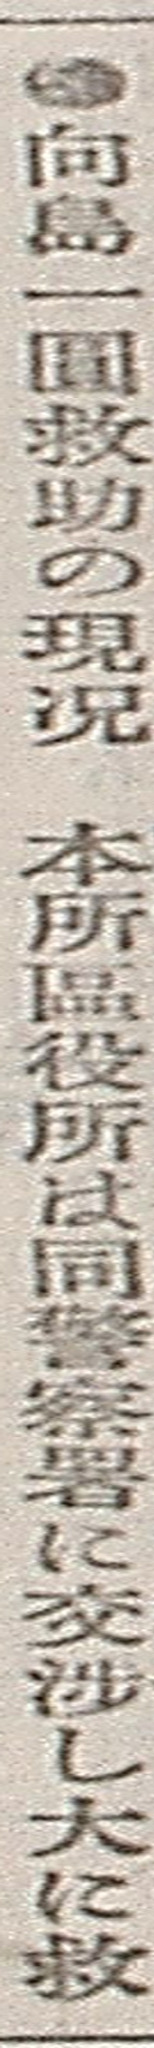●向島一円救助の現況本所区役所は同警察署に交渉し大に救
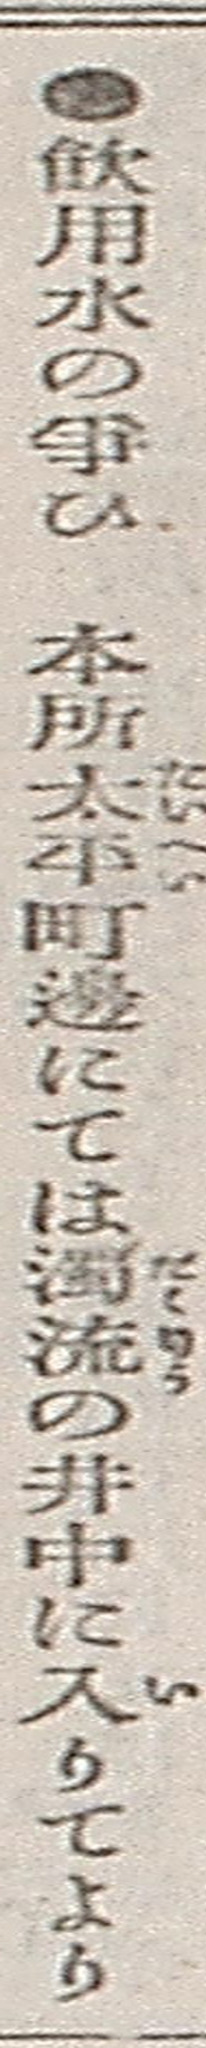●飲用水の争ひ本所太平町辺にては濁流の井中に入りてより
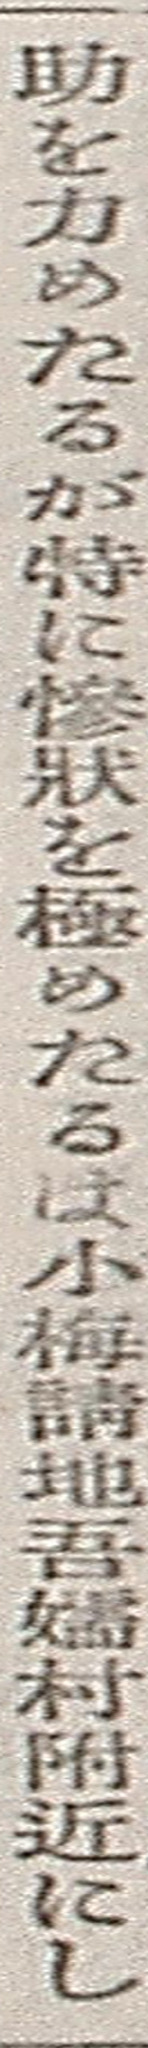助を力めたるが特に惨状を極めたるは小梅請地吾嬬村附近にし
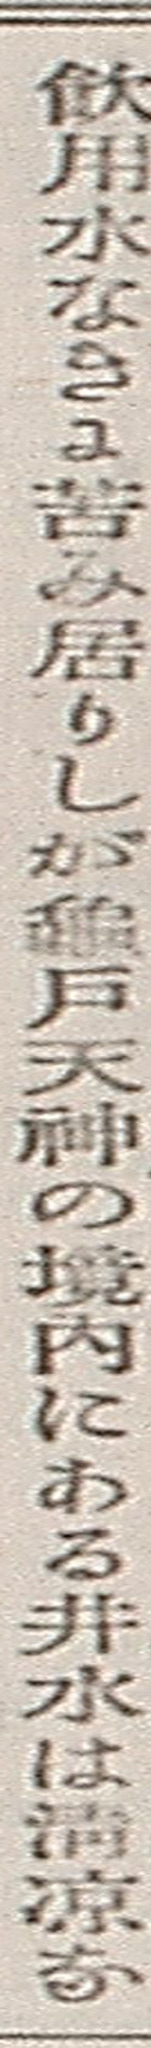飲用水なきに苦み居りしが亀戸天神の境内にある井水は清凉な
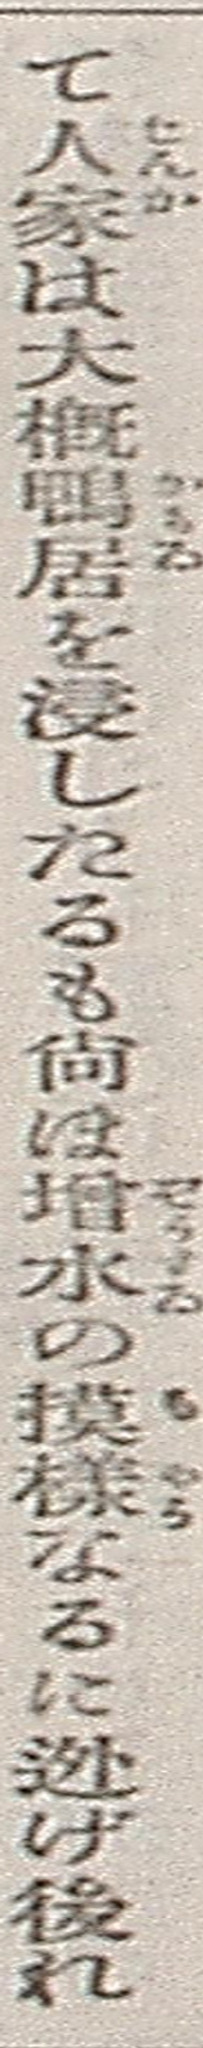て人家は大概鴨居を浸したるも尚ほ増水の模様なるに逃げ後れ
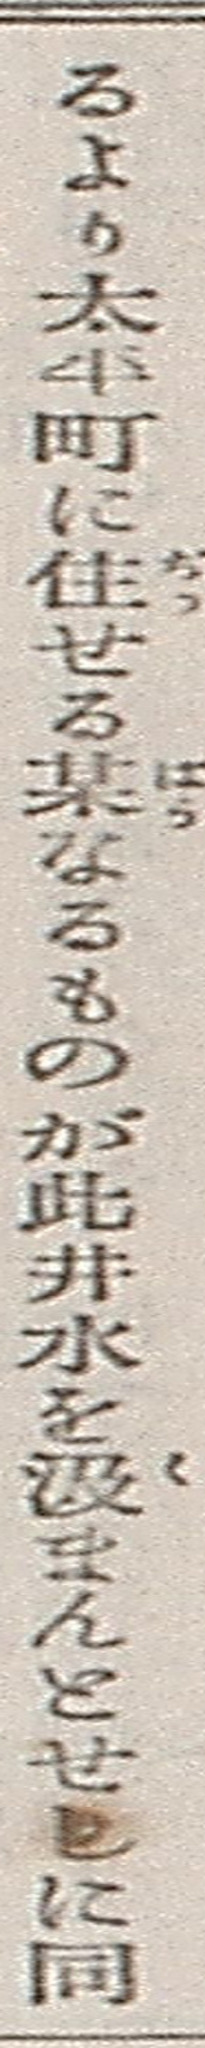るより太平町に住せる某なるものが此井水を汲まんとせしに同
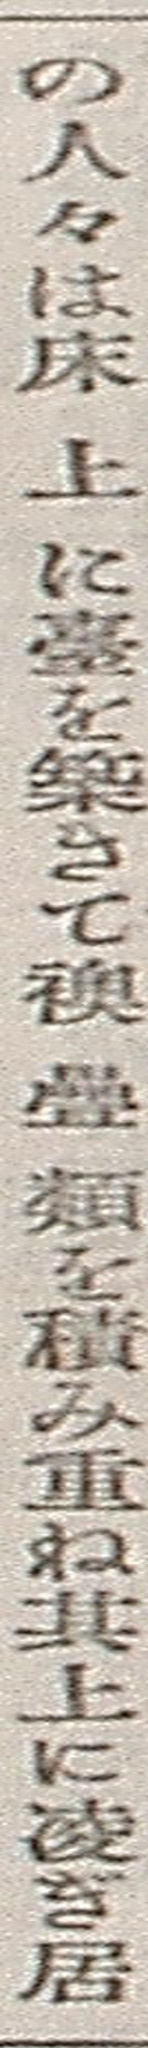の人々は床上に台を築きて襖畳類を積み重ね其上に凌ぎ居
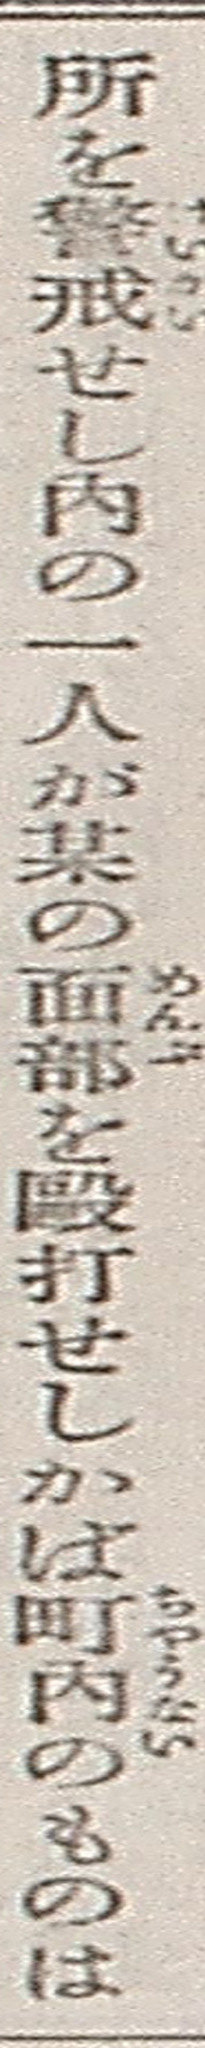所を警戒せし内の一人が某の面部を殴打せしかば町内のものは
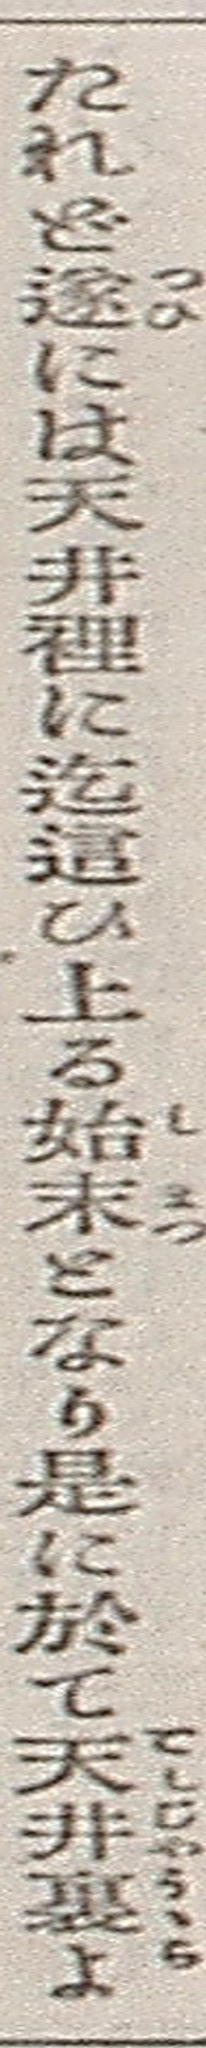たれど遂には天井裡に迄這ひ上る始末となり是に於て天井裏よ
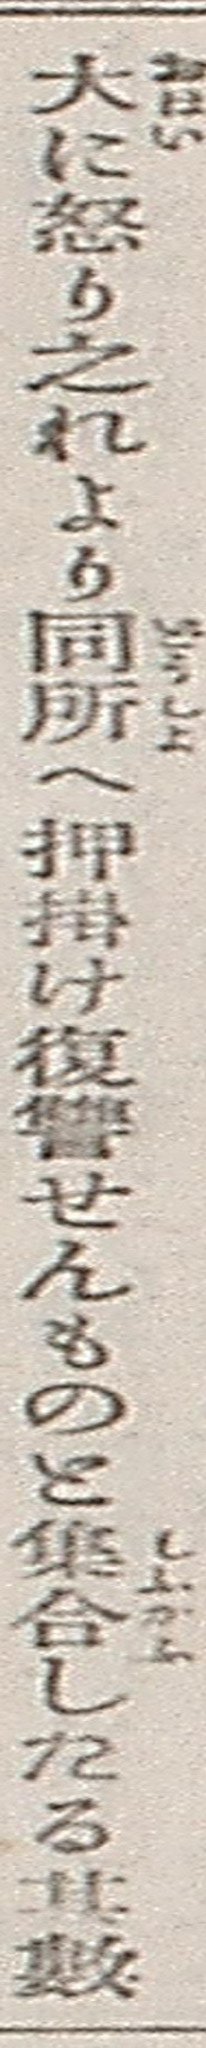大に怒り之れより同所へ押掛け復讐せんものと集合したる其数
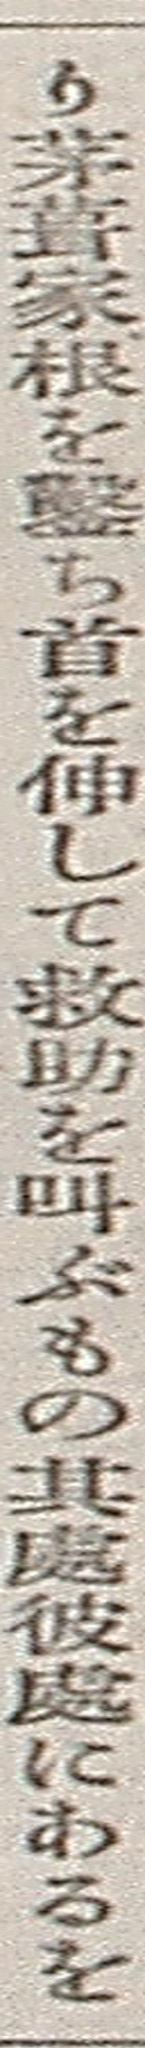り茅葺屋根を鑿ち首を伸して救助を叫ぶもの其処彼処にあるを
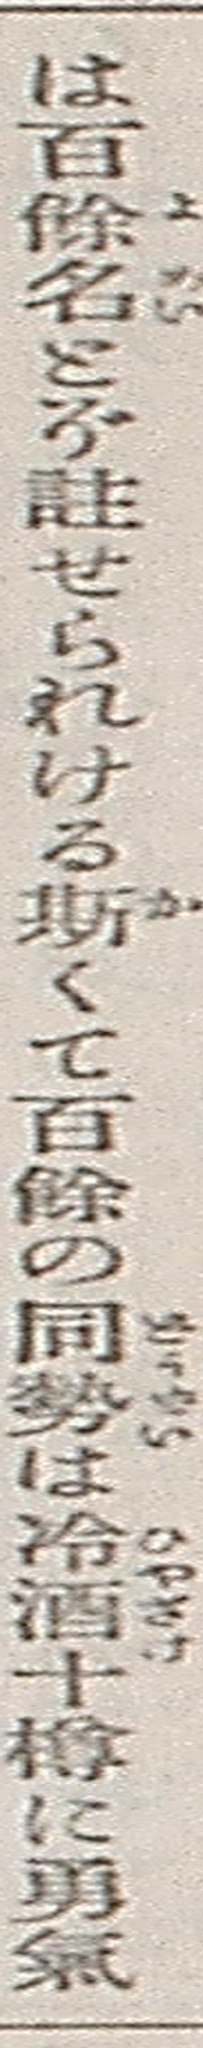は百余名とが註せられける斯くて百余の同勢は冷酒十樽に勇気
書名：風俗畫報臨時増刊第百二十四號　洪水地震被害録（上）
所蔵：東京大学地震研究所図書室 Earthquake Research Institute Library, The University of Tokyo, JAPAN
